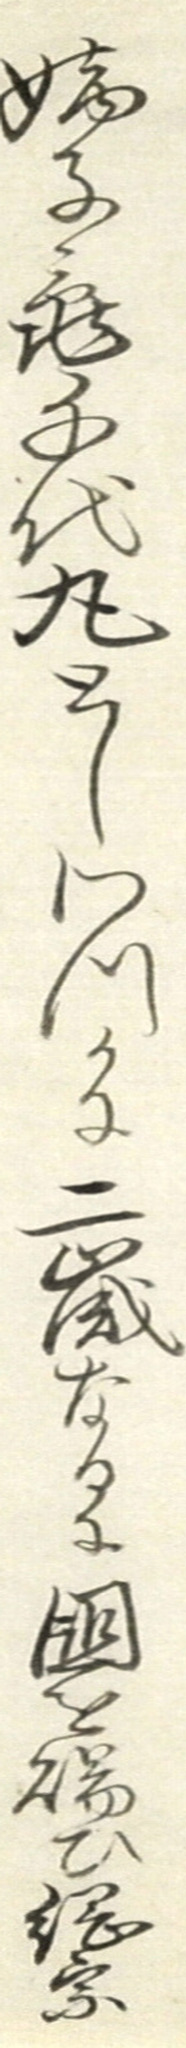嫡子亀千代丸としわつかに二歳なるに国を賜ひ綱宗
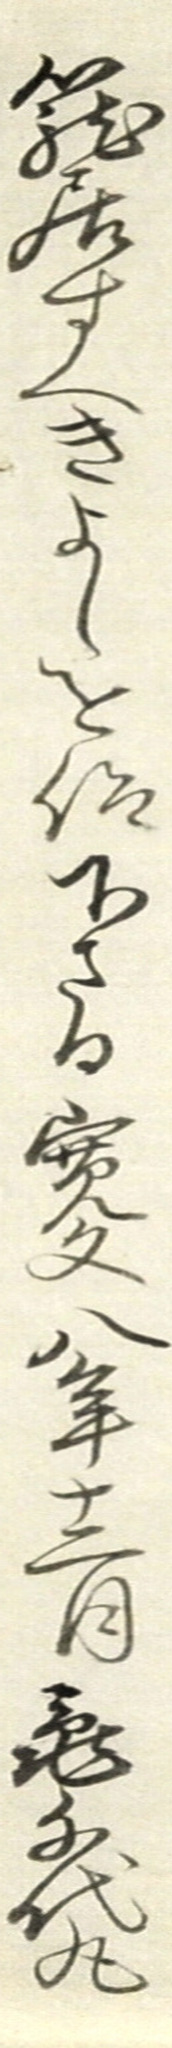籠居すへきよしを仰下さる寛文八年十二月亀千代丸
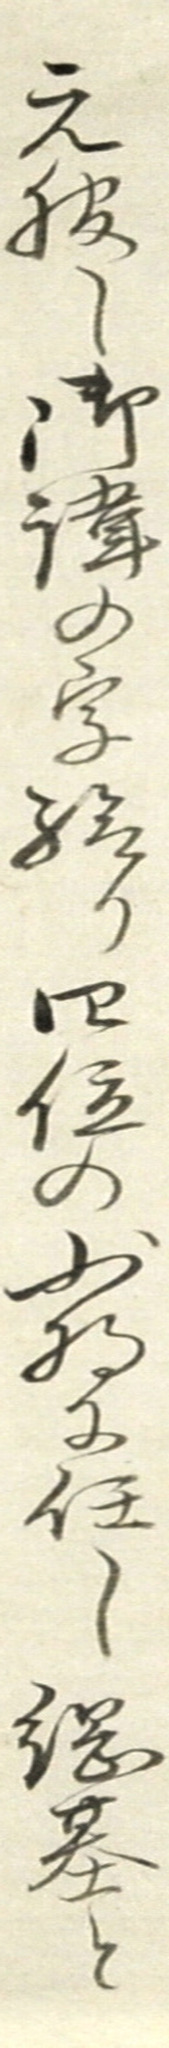元服し御諱の字給り四位の少将に任し綱基と
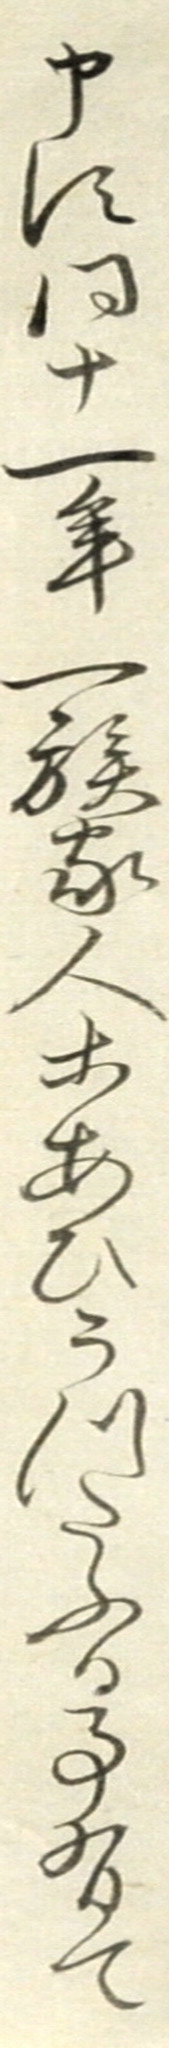申す同十一年一族家人等あひうつたふる事有て
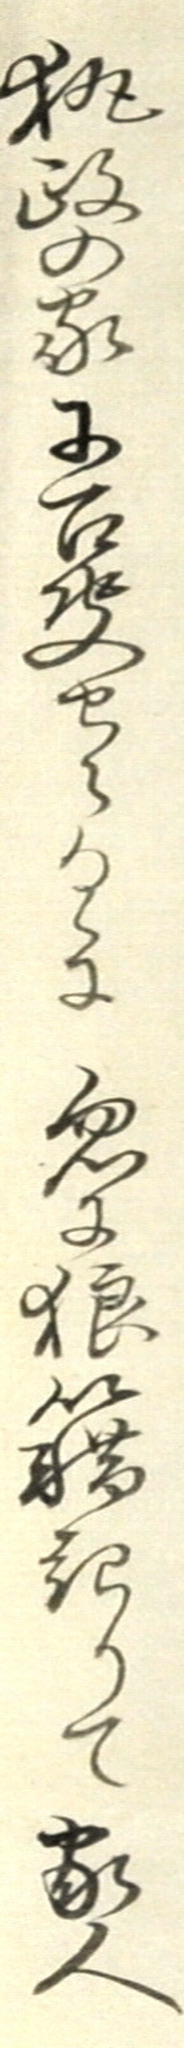執政の家に召決せらるゝに忽に狼藉起りて家人

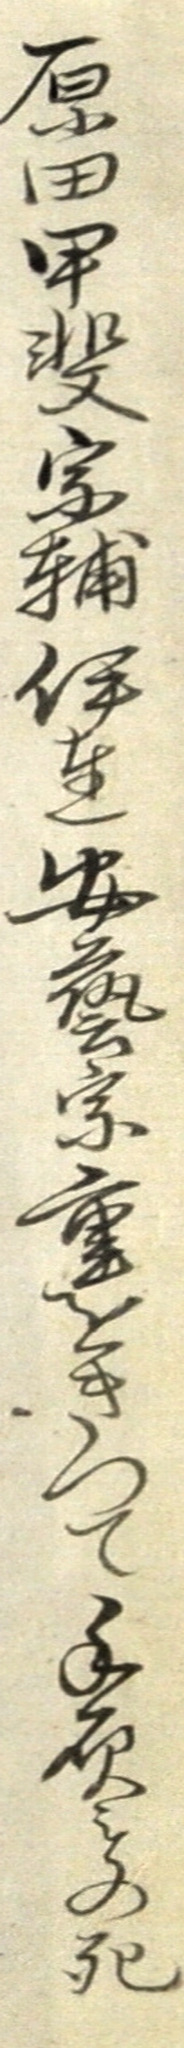原田甲斐宗輔伊達安芸宗重をきつて手負もの死
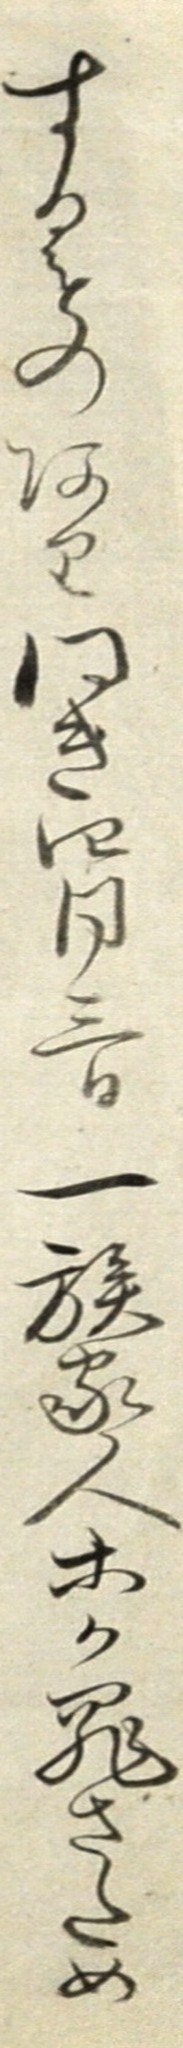するものあり同き四月三日一族家人等か罪さため
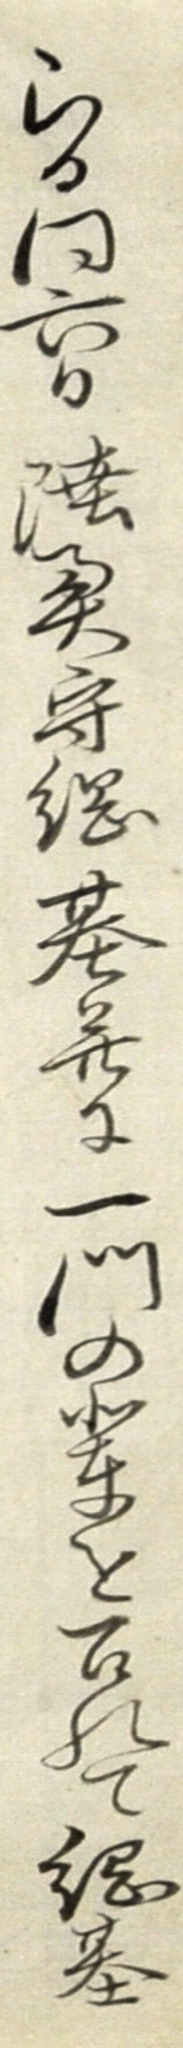らる同六日陸奥守綱基幷に一門の輩を召れて綱基
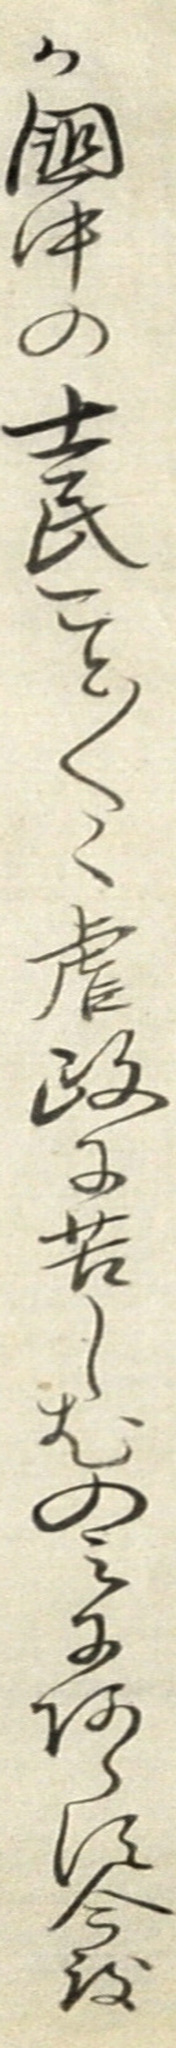か国中の士民こと〳〵く虐政に苦しむのみにあらす今度
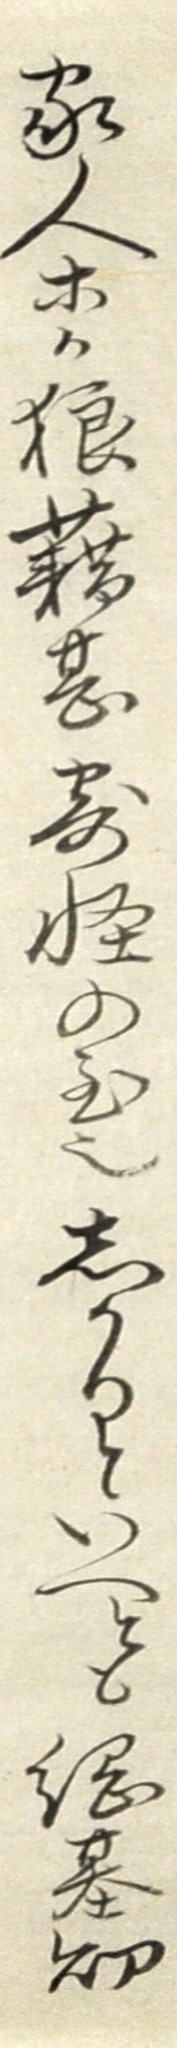家人等か狼藉甚奇怪の至也しかるといへとも綱基幼
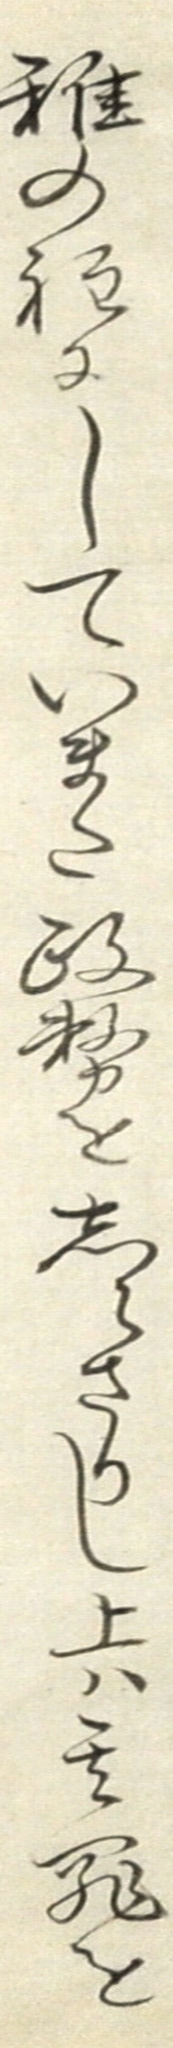稚の程にしていまた政務をしらさりし上は其罪を
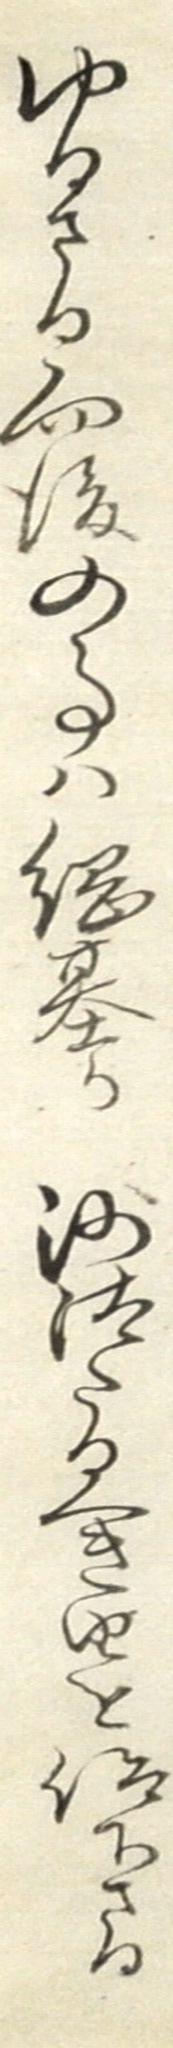ゆるさる向後の事は綱基か沙汰たるへき由を仰下さる
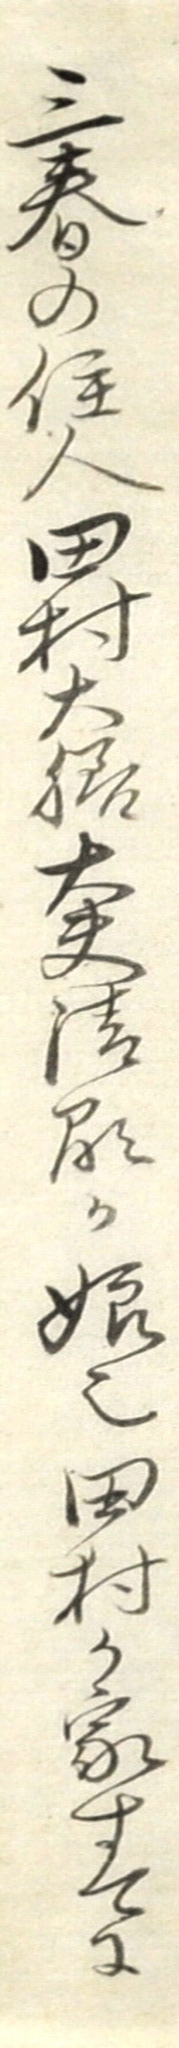三春の住人田村大膳大夫清顕か娘也た田村か家すてに
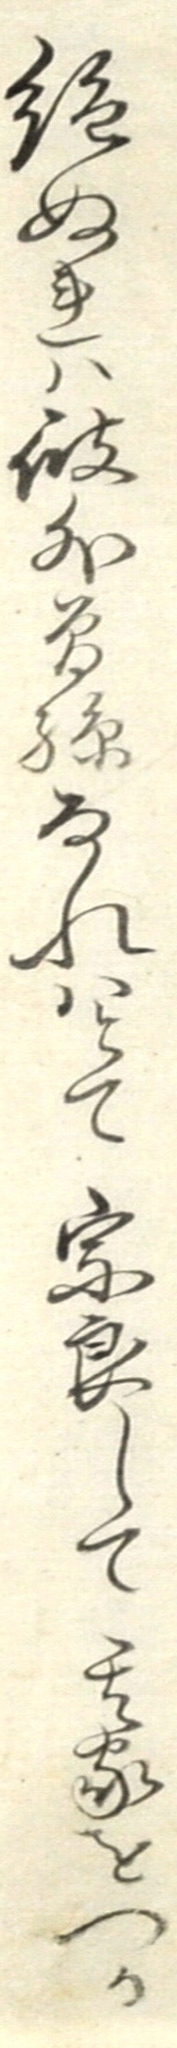絶ぬれは彼外曽孫なれはとて宗良して其家をつか
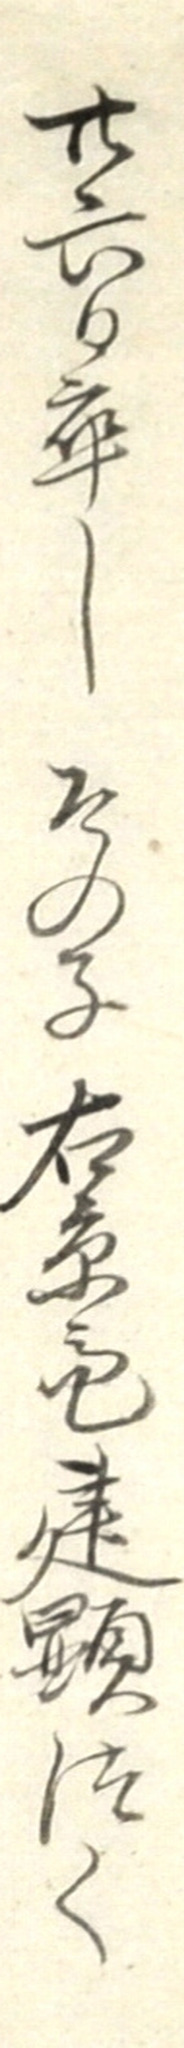廿六日卒しその子右京亮建顕つく
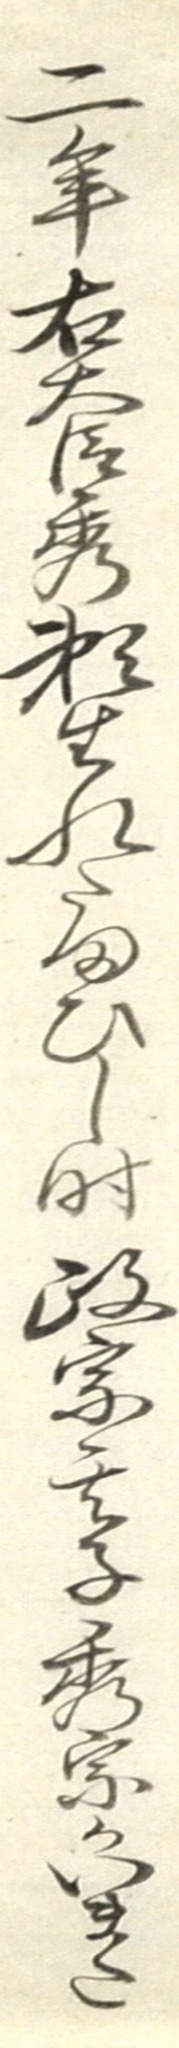二年右大臣秀頼生れたまひし時政宗其子秀宗かいまた
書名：藩翰譜（七・下）
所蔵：伊那市立高遠町図書館・合同会社AMANE
